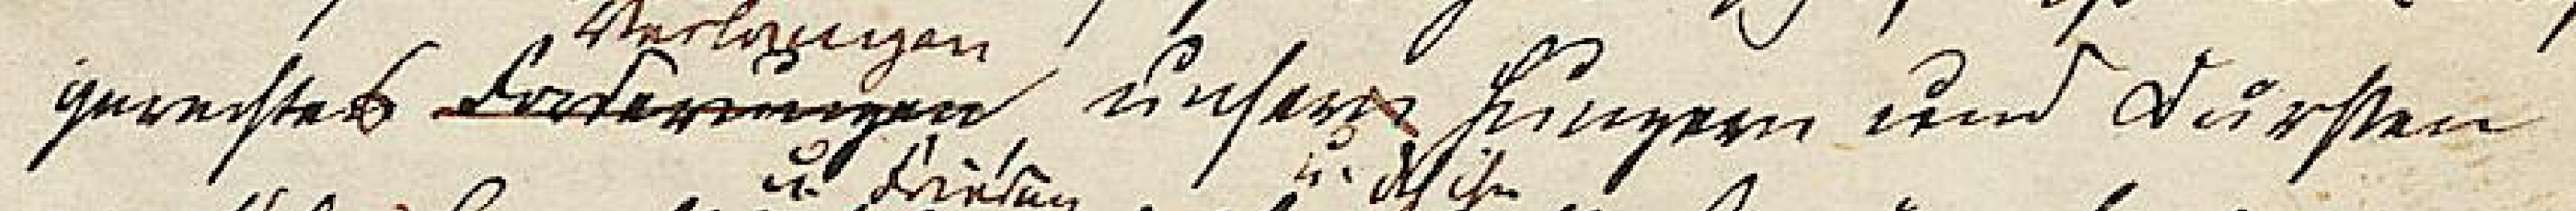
gerechtes Forderungen unsern Hungern und Dürsten
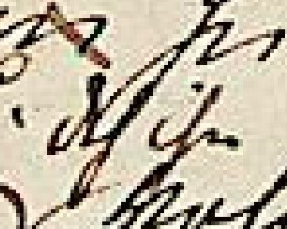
durch ihn
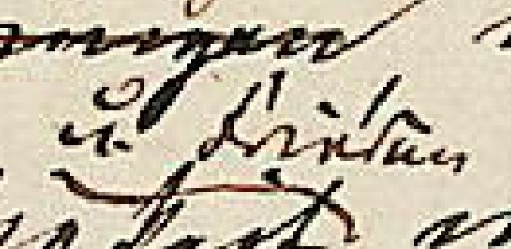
und Frieden
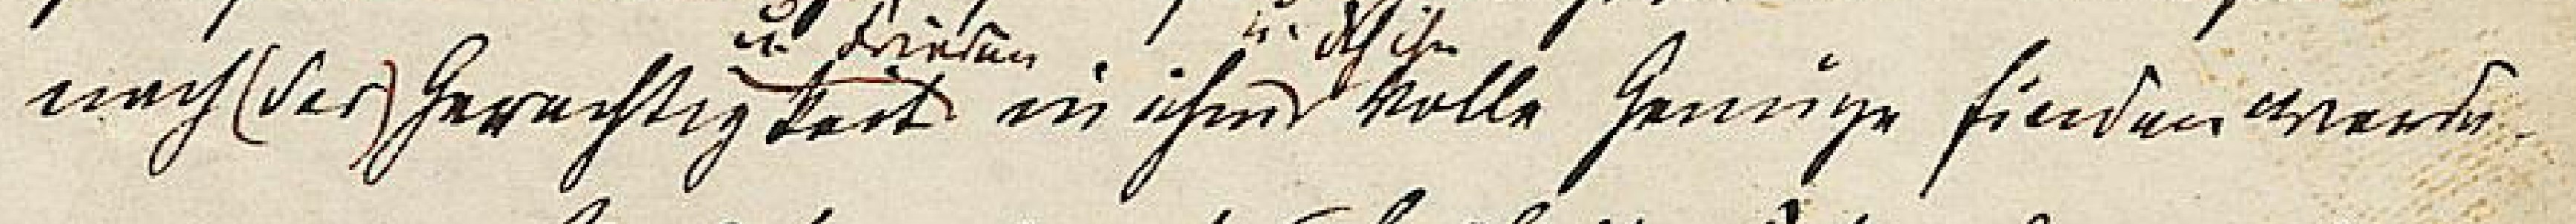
nach (der) Gerechtigkeit in ihm volle Genüge finden werden
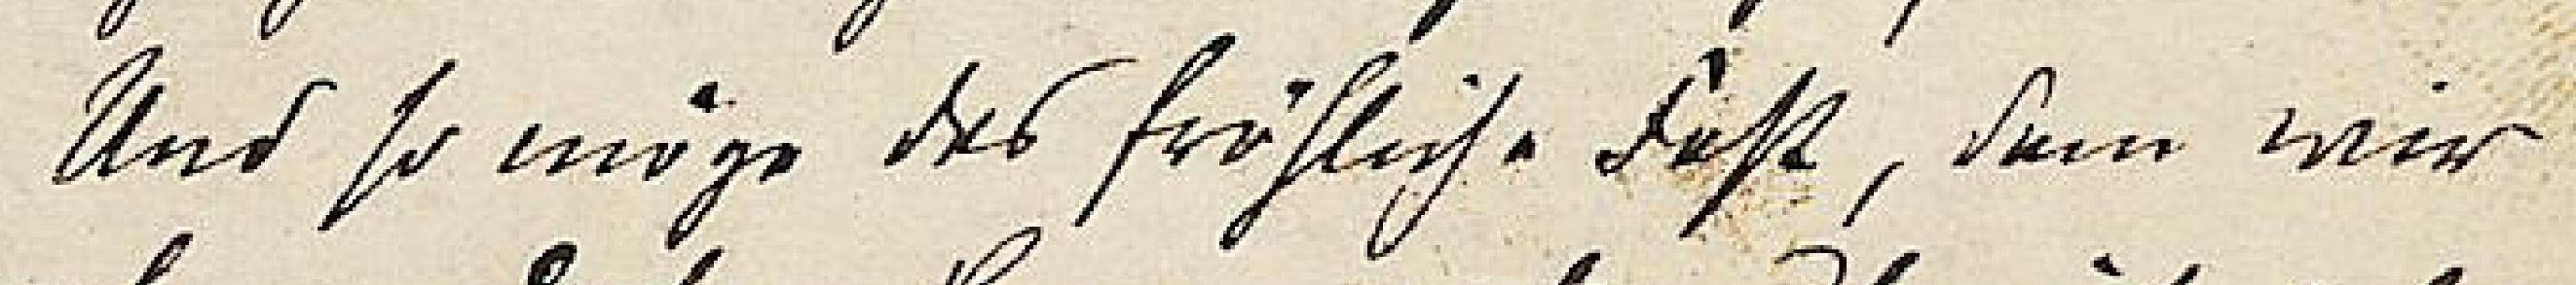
Und so möge das fröhliche Fest, dem wir
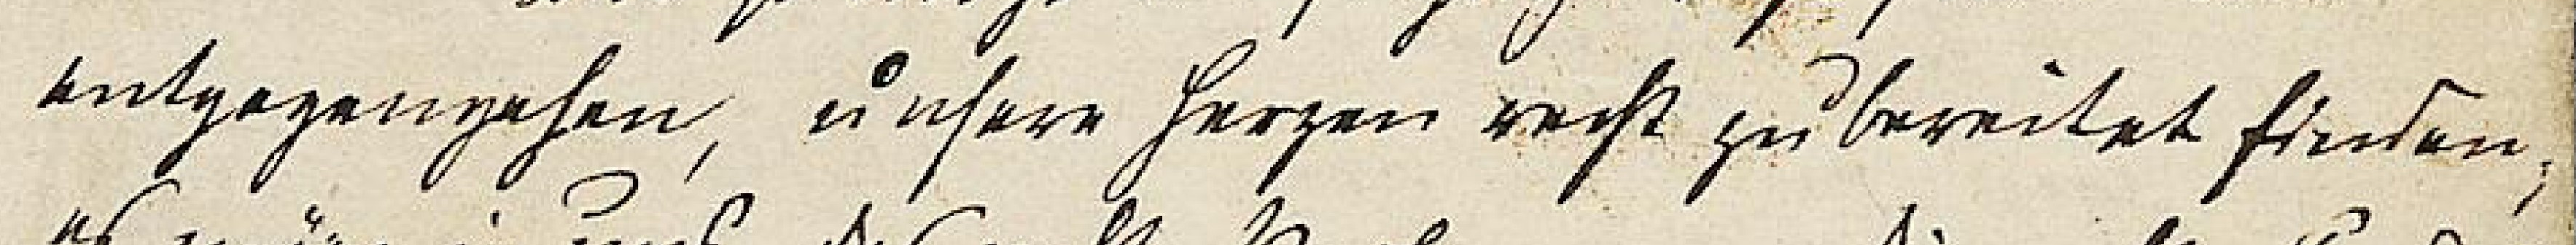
entgegengehen, unsere Herzen recht zubereitet finden,
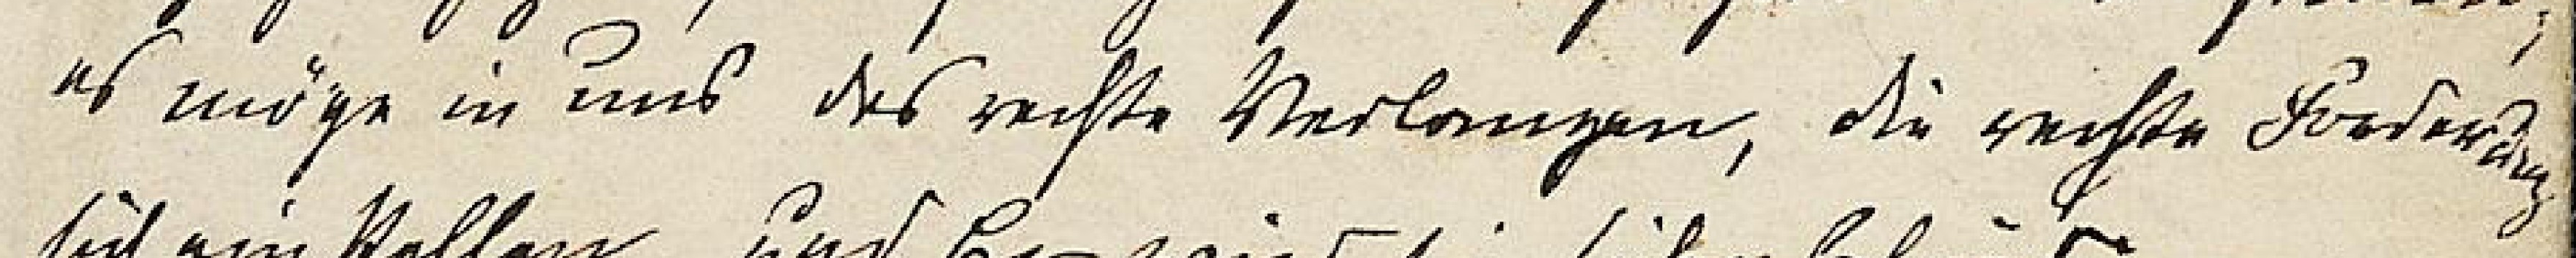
es möge in uns das rechte Verlangen, die rechte Forderung
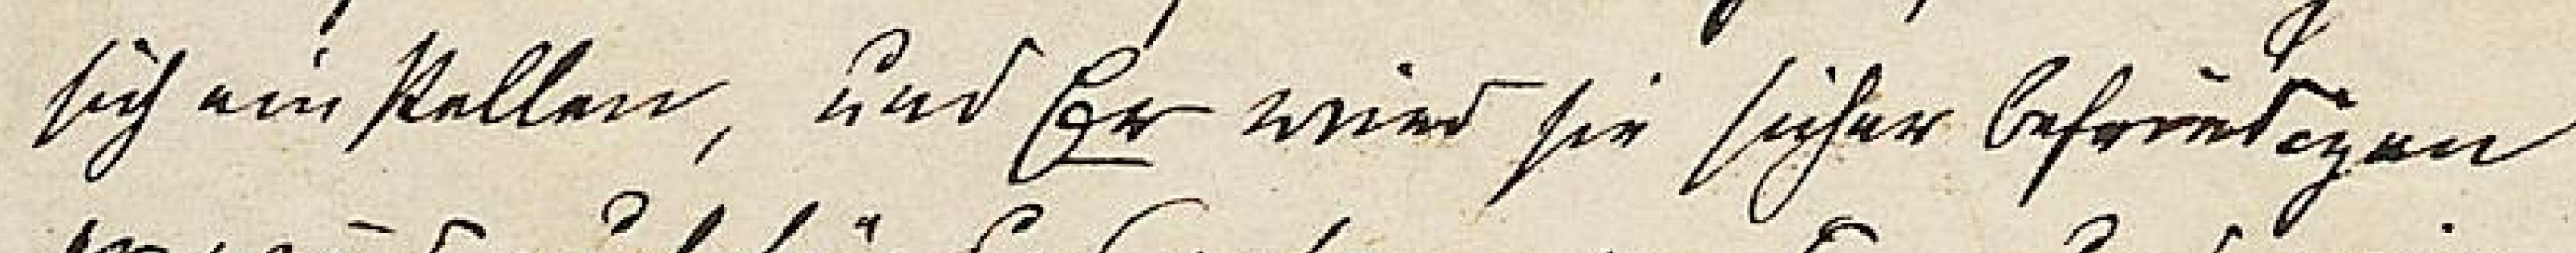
sich einstellen, und Er wird sie sicher befriedigen
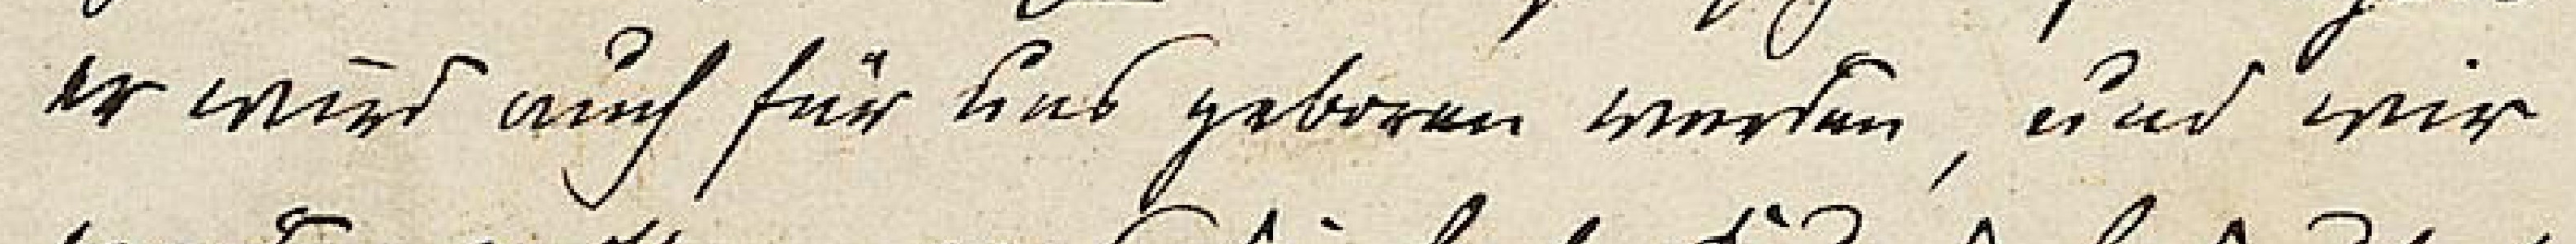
er wird auch für uns geboren werden, und wir
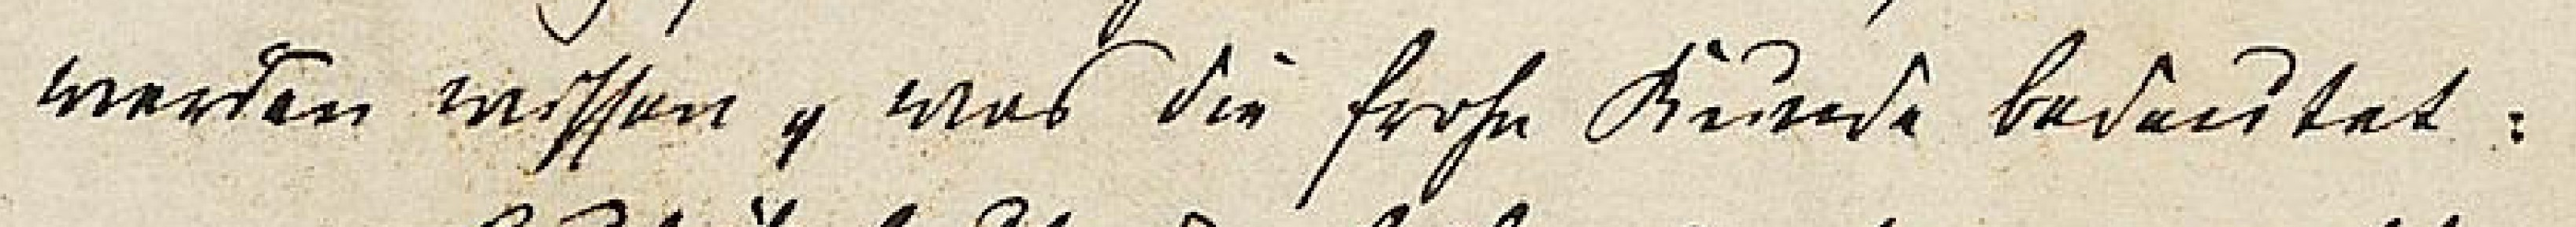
werden wissen, was die frohe Kunde bedeutet:
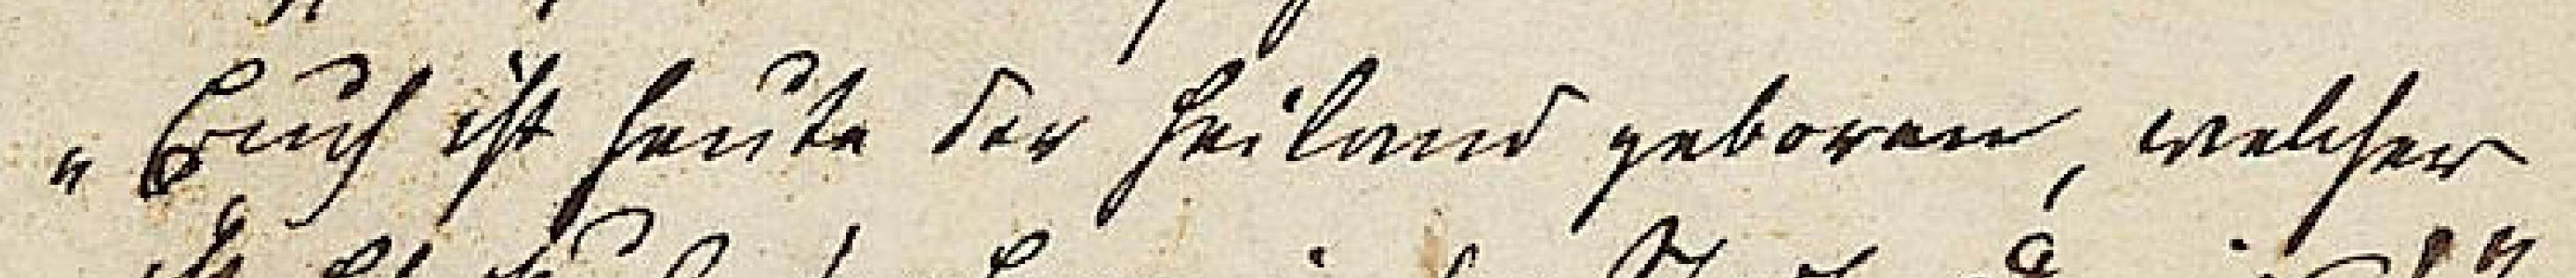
"Euch ist heute der Heiland geboren, welcher
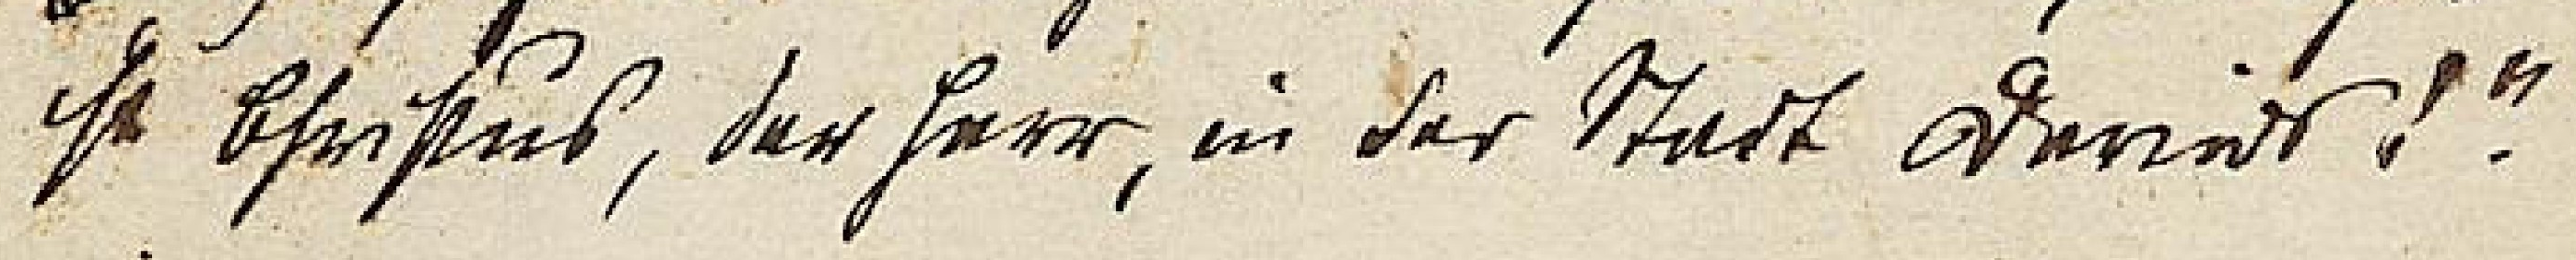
ist Christus, der Herr, in der Stadt Davids!"
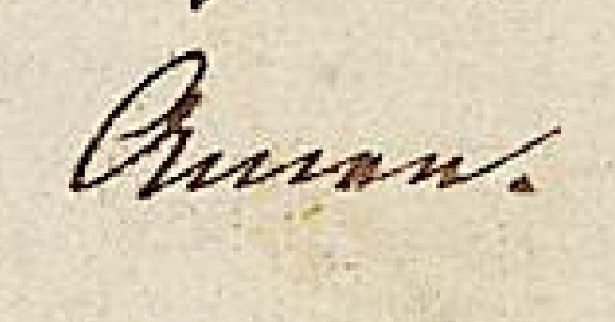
Amen.
